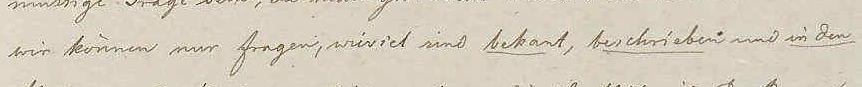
wir können nur fragen, wieviel sind bekant, beschrieben und in den
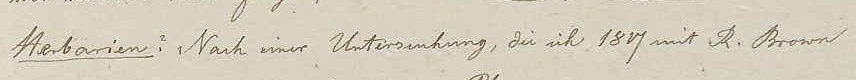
Herbarien? Nach einer Untersuchung, die ich 1807 mit R. Brown
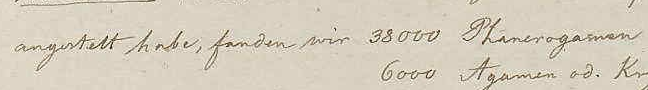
angestelt habe, fanden wir 38000 Phanerogamen
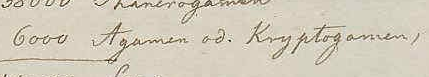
6000 Agamen od. Kryptogamen,
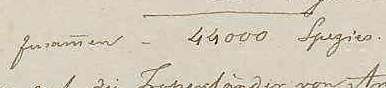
zusam̃en – 44000 Spezies.
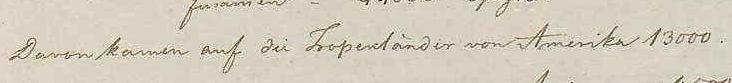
Davon kamen auf die Tropenländer von Amerika 13000.
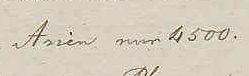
― ― ― ― Asien nur 4500.
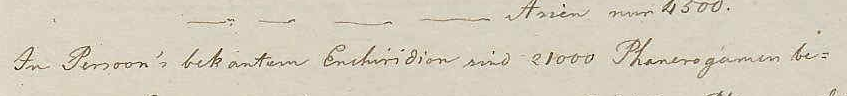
In Persoon's bekantem Enchiridion sind 21000 Phanerogamen be-
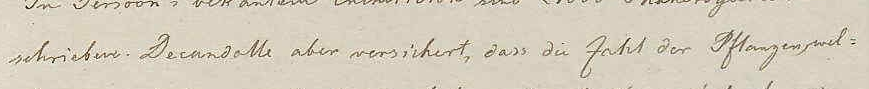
schrieben. Decandolle aber versichert, dass die Zahl der Pflanzen, wel-
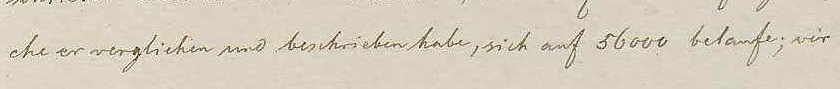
che er verglichen und beschrieben habe, sich auf 56000 belaufe; wir
